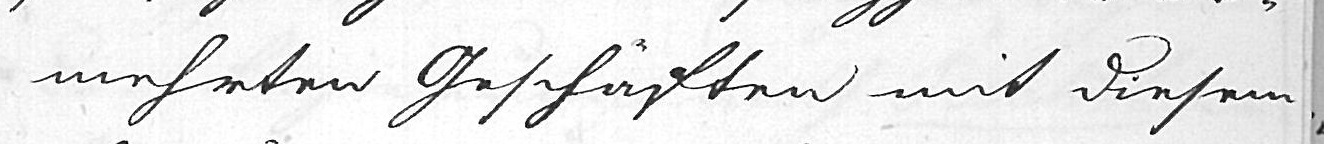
mehrten Geschäften mit diesem
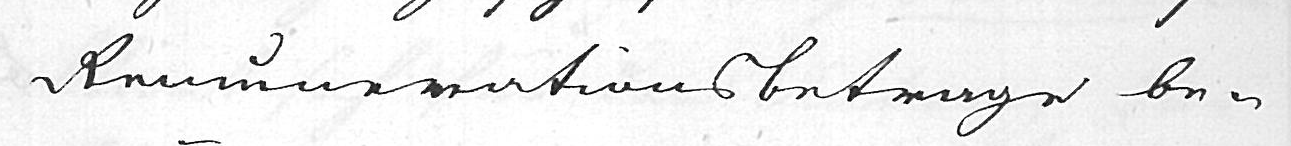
Remunerationsbetrage be-
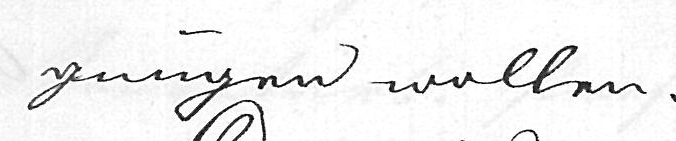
gnügen wollen.
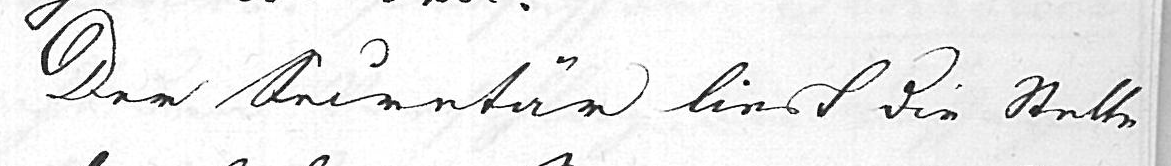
Der Secretär liest die Stelle
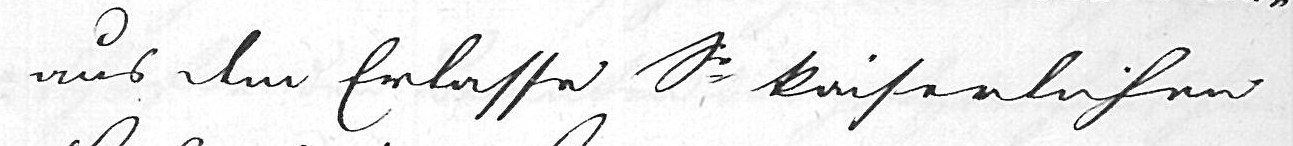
aus dem Erlasse Sr. kaiserlichen
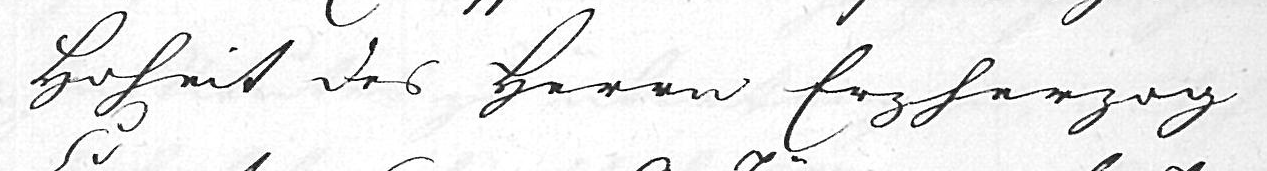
Hoheit des Herrn Erzherzog
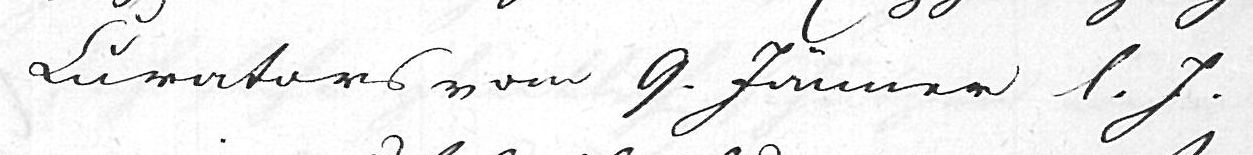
Curators vom 9. Jänner l. J.
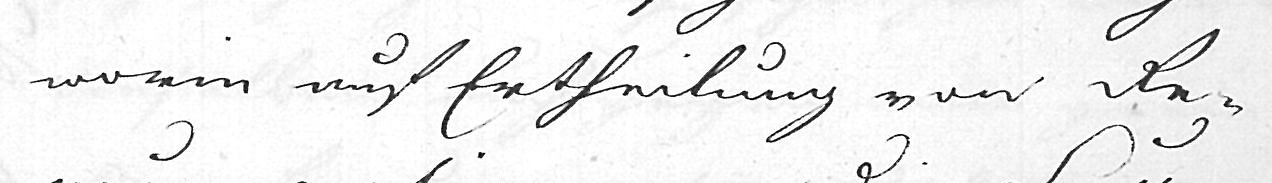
worin auf Ertheilung von Re-
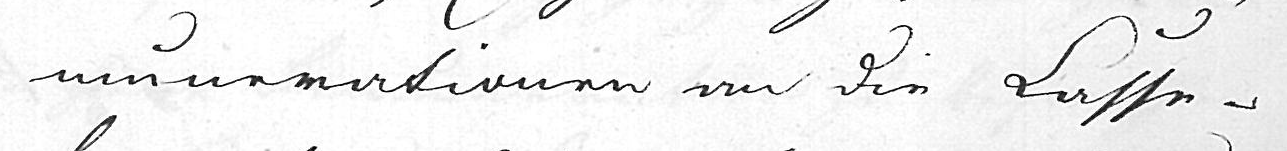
munerationen an die Casse-
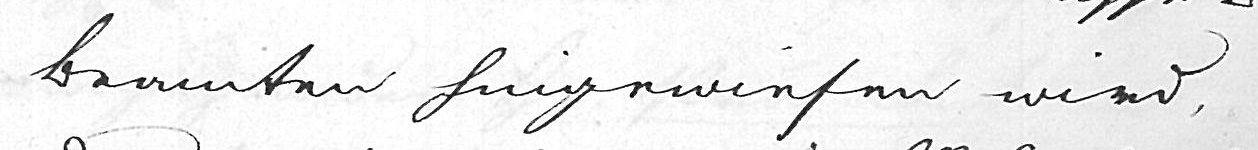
beamten hingewiesen wird,
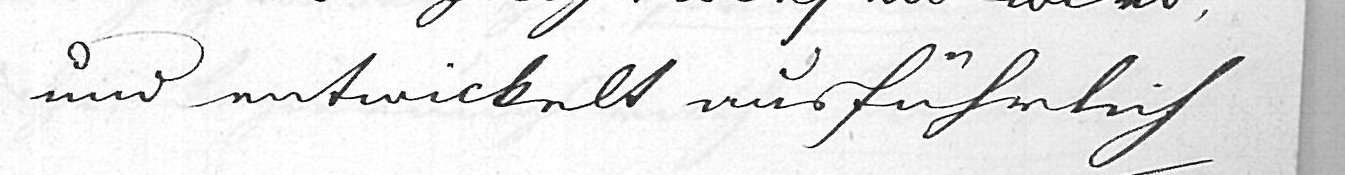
und entwickelt ausführlich
